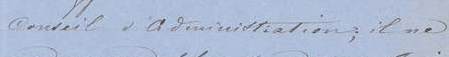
Conseil d'Administration; il ne
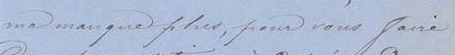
me manque plus, pour vous faire
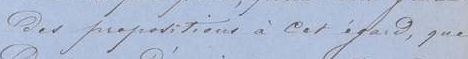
des propositions à cet égard, que
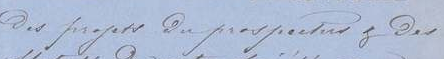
des projets du prospectus & des
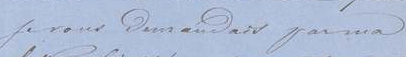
je vous demandais par ma
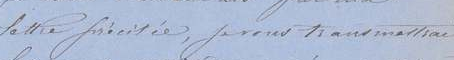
lettre précitée, je vous transmettrai
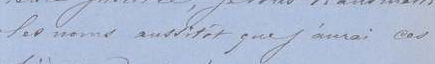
les noms aussitôt que j'aurai ces
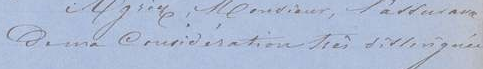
de ma considération très distinguée
